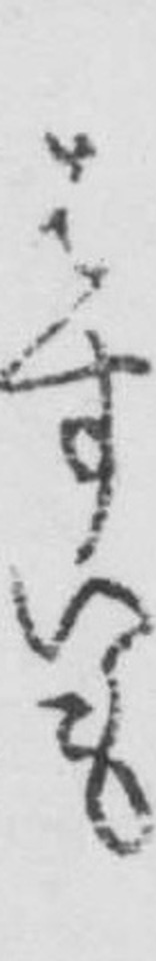はすいも
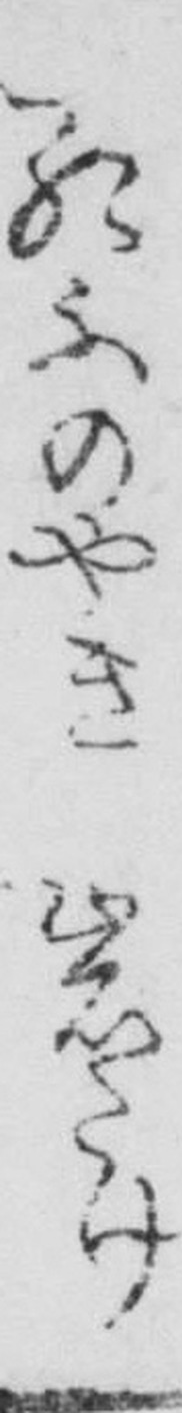紅？ふのやき岩たけ
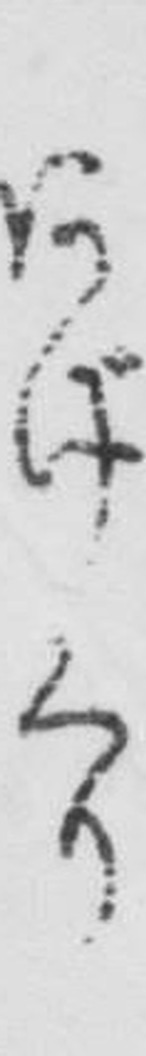あげくり
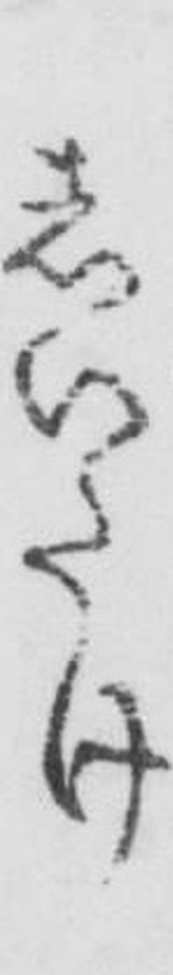しいたけ
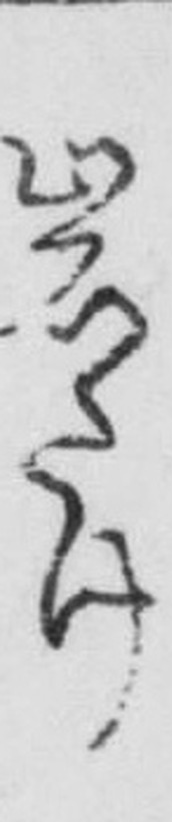岩たけ
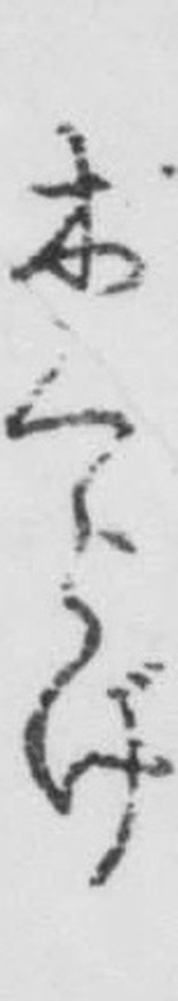木くらげ
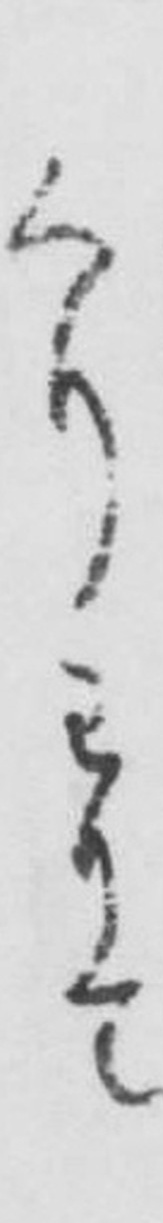くりわりて
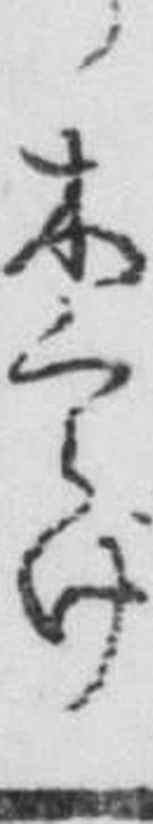木くらげ
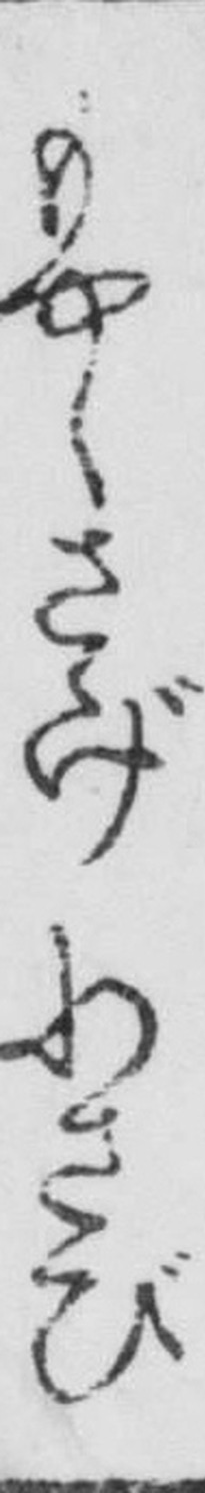もやしさゝげわさび
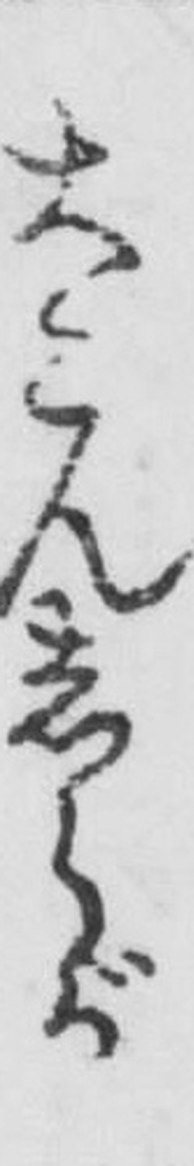大こんしらが
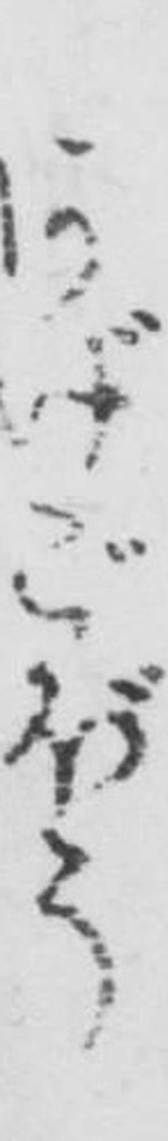あげごぼう
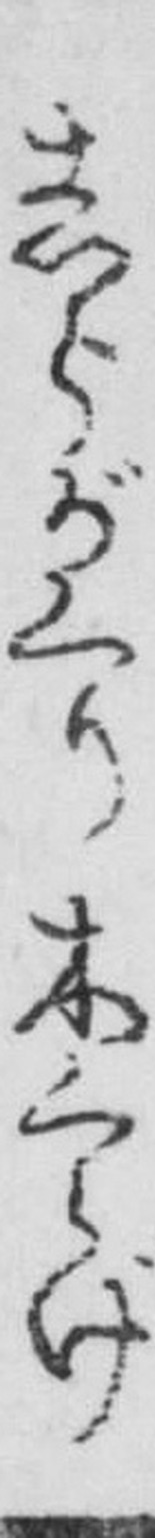しらがくり木くらげ
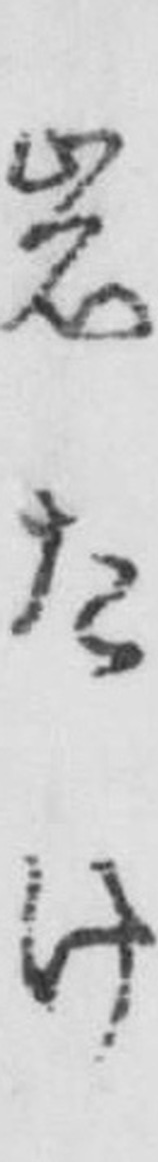岩たけ
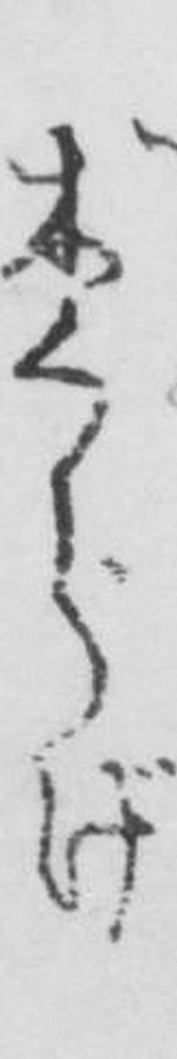木くらげ
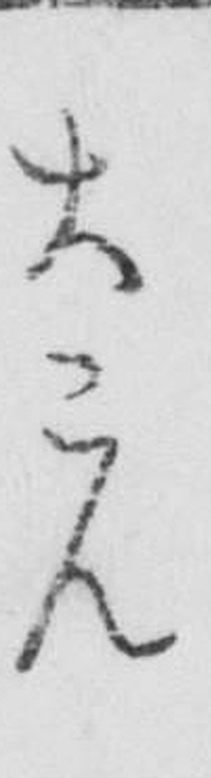大こん
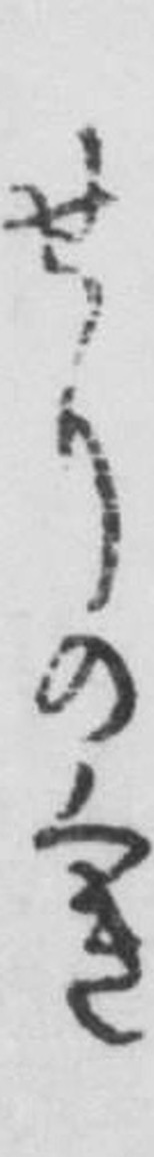せりのくき
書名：諸家通用/即席料理
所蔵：大阪府立大学学術情報センター 国文学研究資料館
